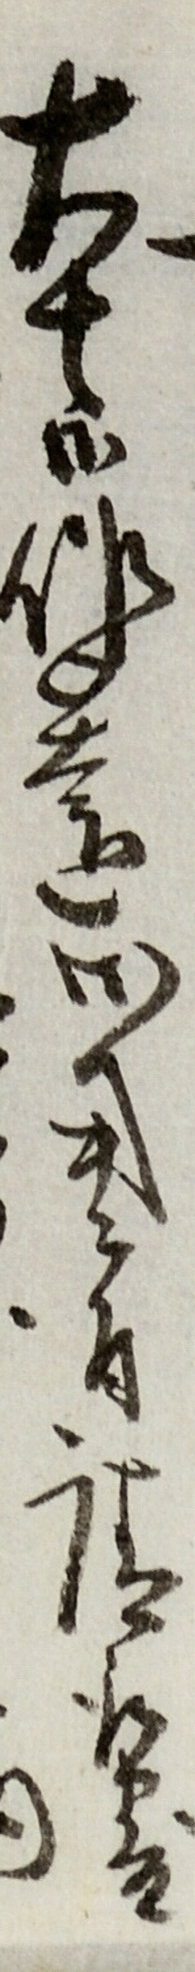右者御作園御用ニ付請取申度
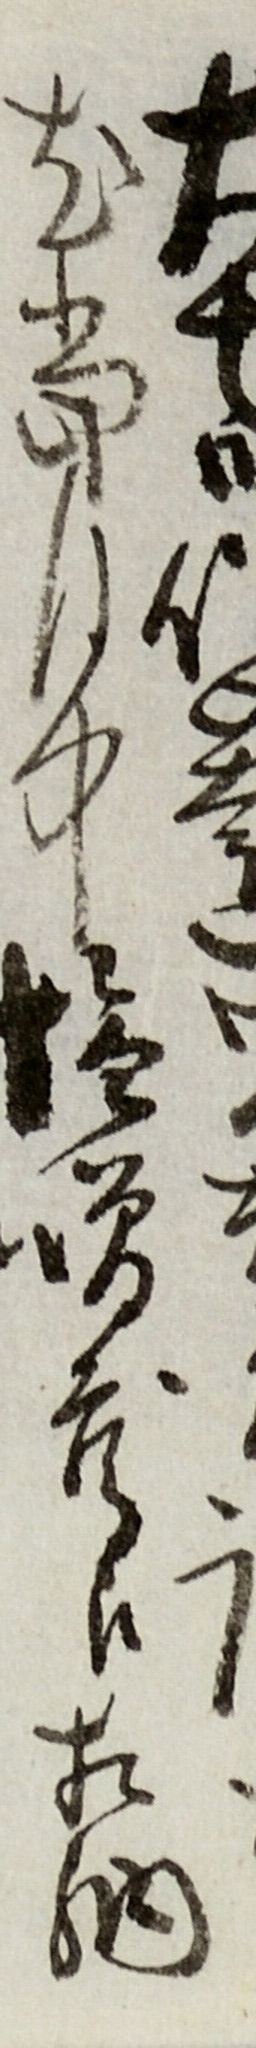尤当月中塩噌蔵江相納
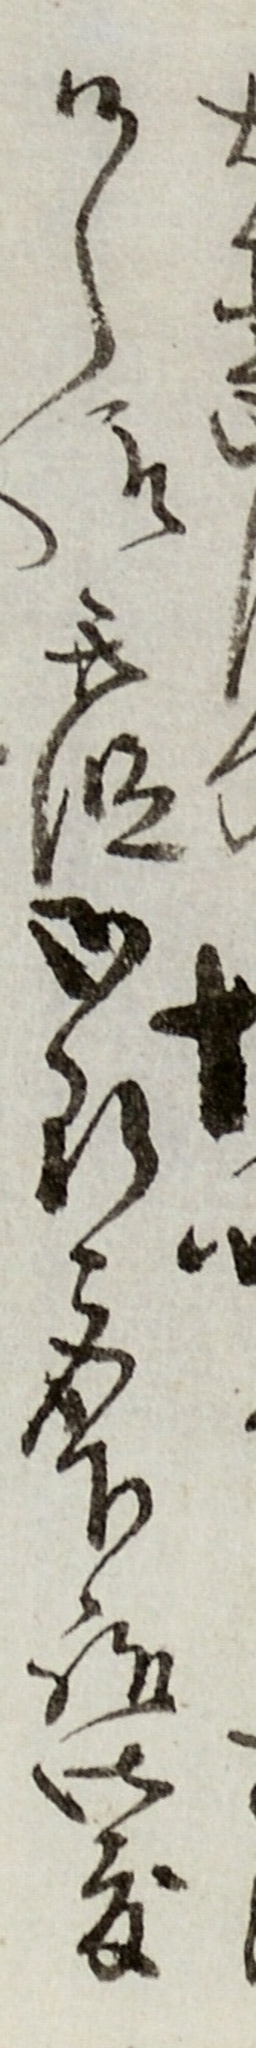候之様此段御断被成下候様此度
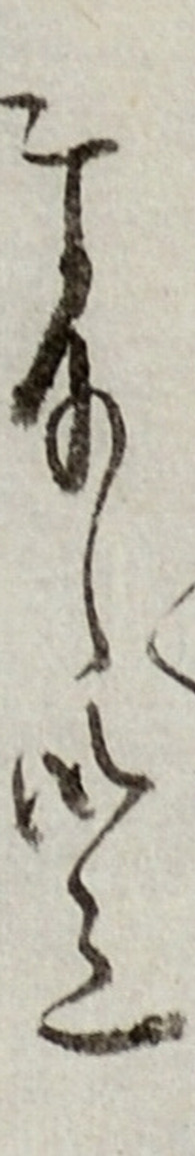奉存候以上
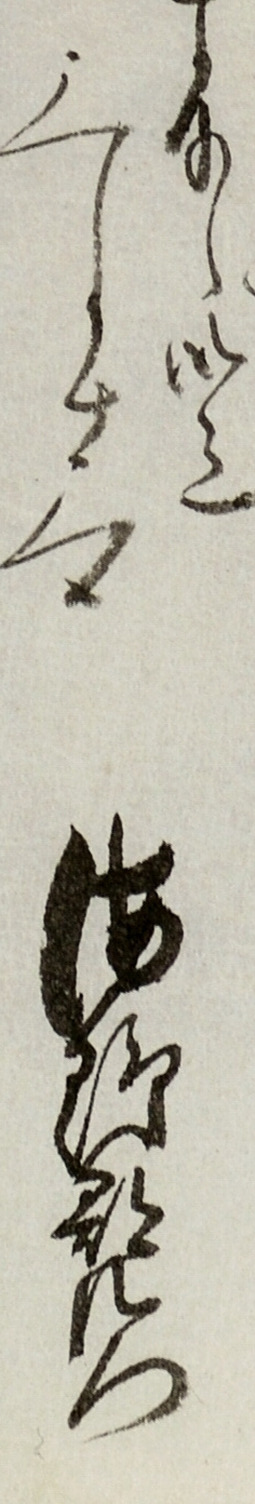三月十三日海野郡左衛門
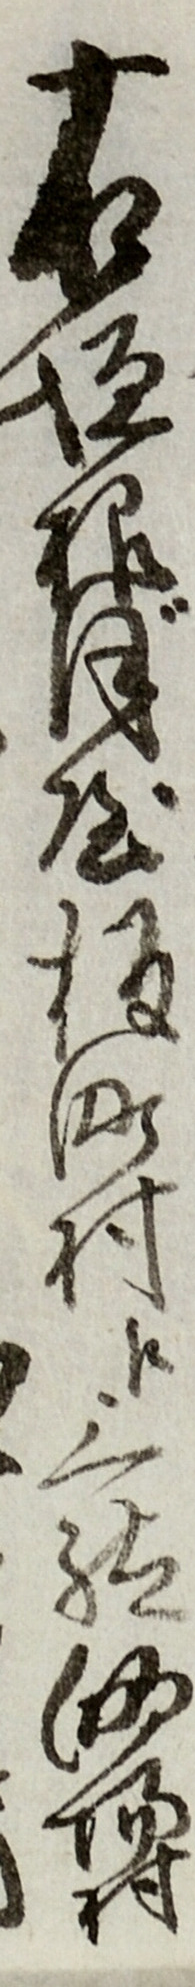右垣根板町村江三駄的場村
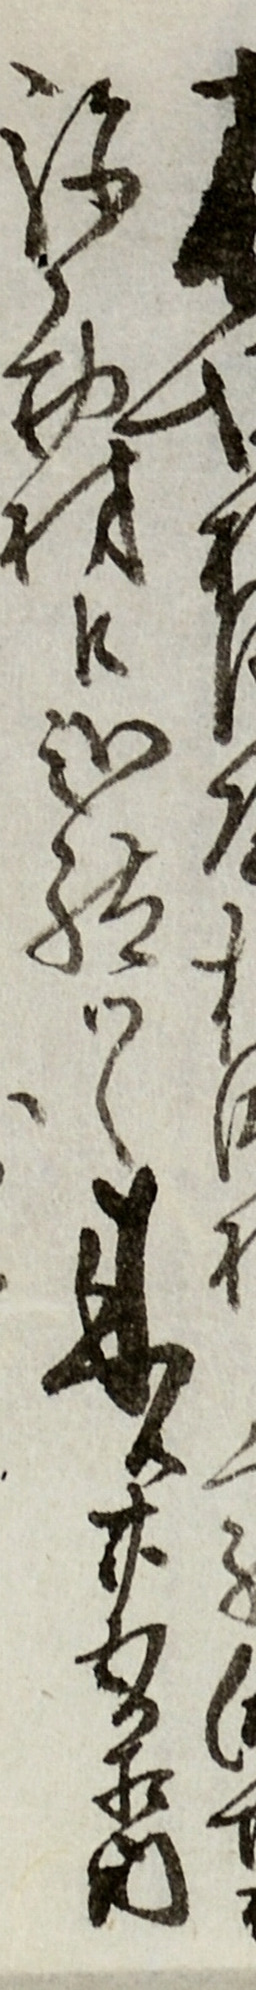弥勒村江弐駄ツヽ来ル廿五日相納
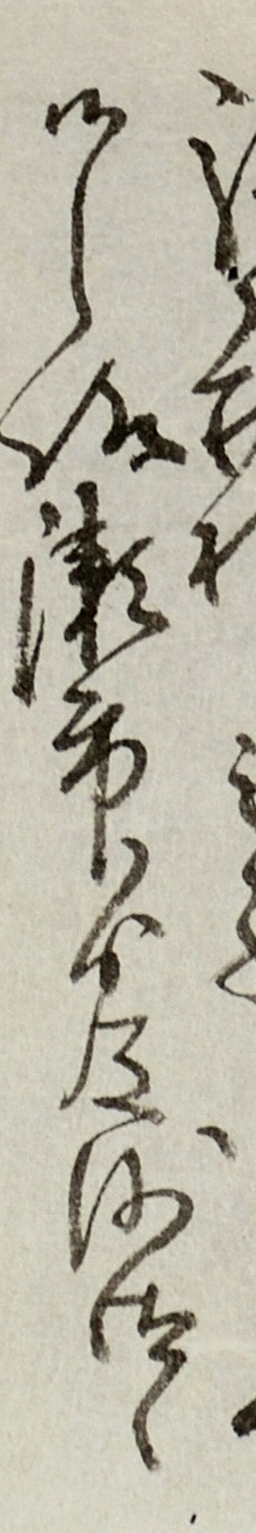候之様瀬市ゟ及沙汰候
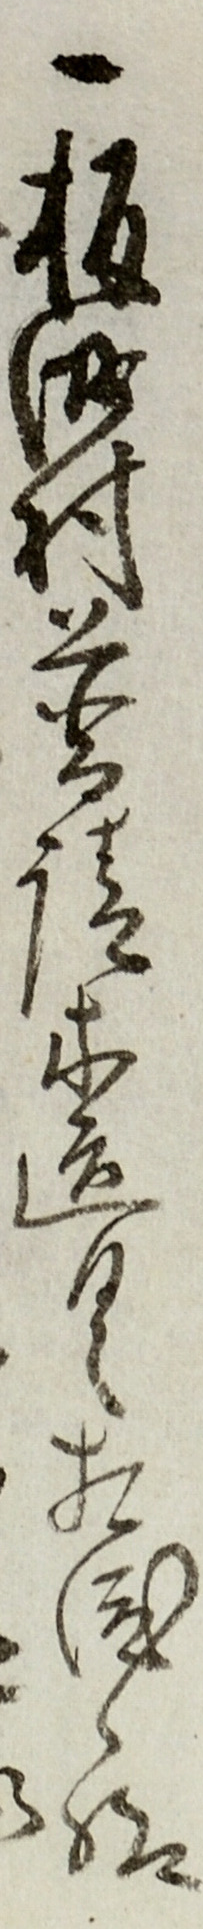一板町村普請木道具相渡候様
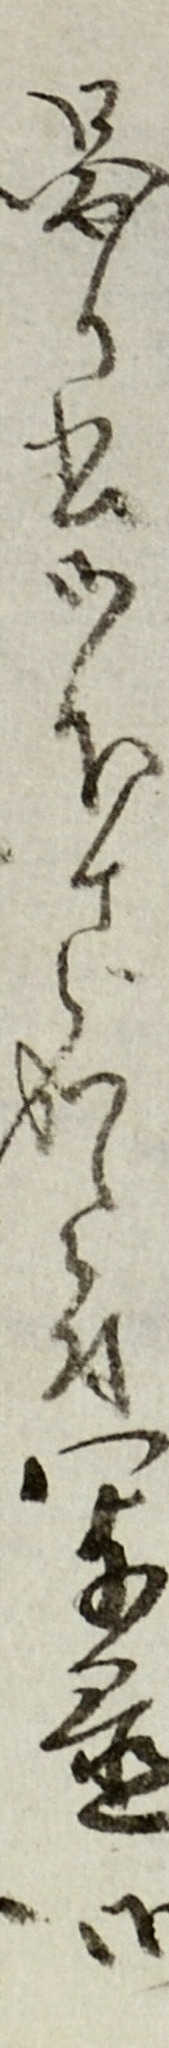図り書御下ケ被成候ニ付写置御
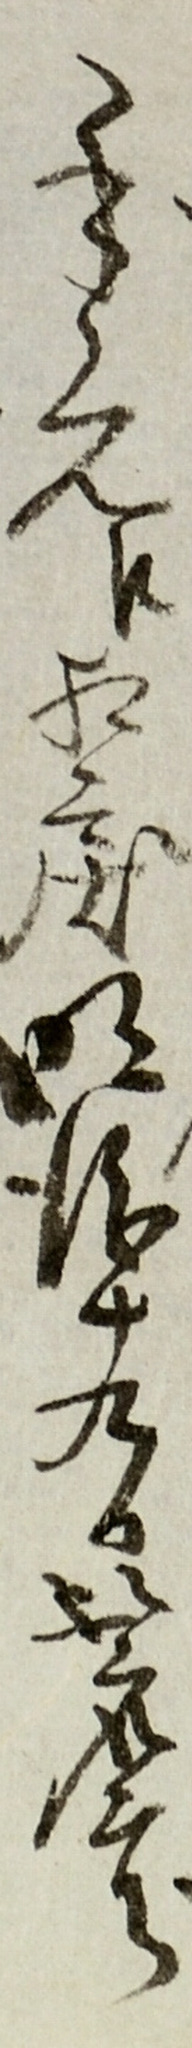手元江相戻明後十九日麗蔵
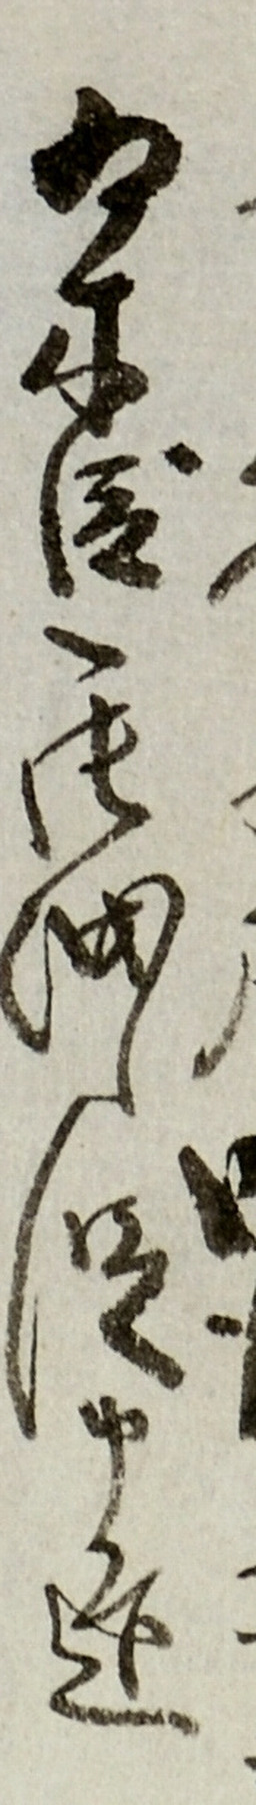為木渡罷越候段申達
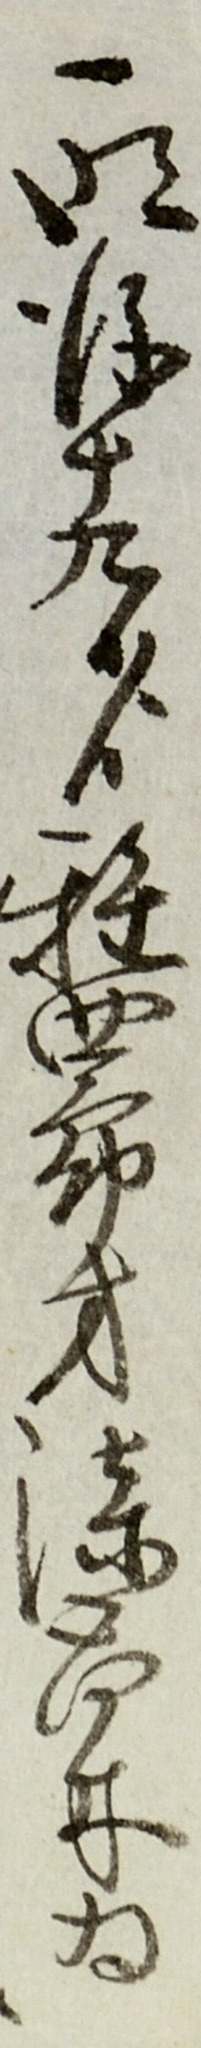一明後十九日ゟ雅四郎方漆苗木為
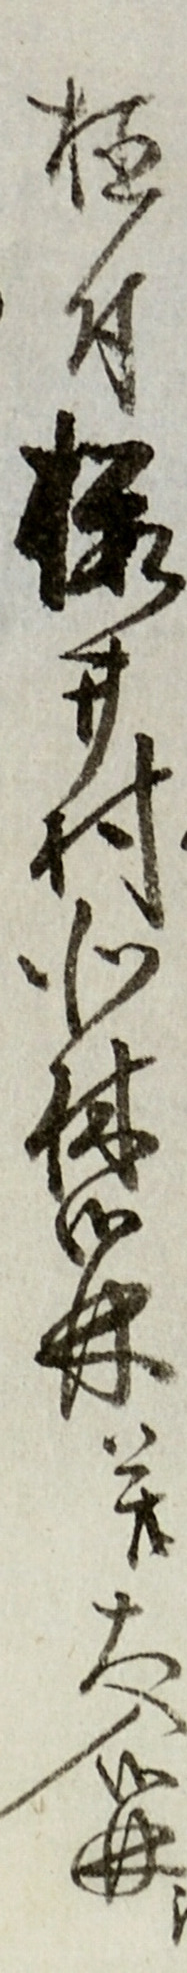植付桜井村北林御林幷大入御林江
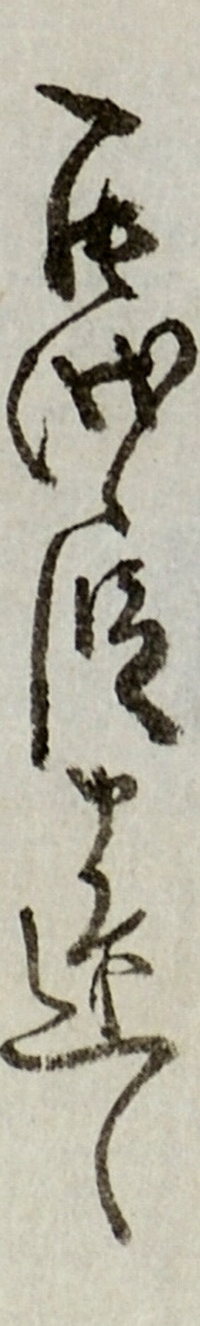罷越候段申達候
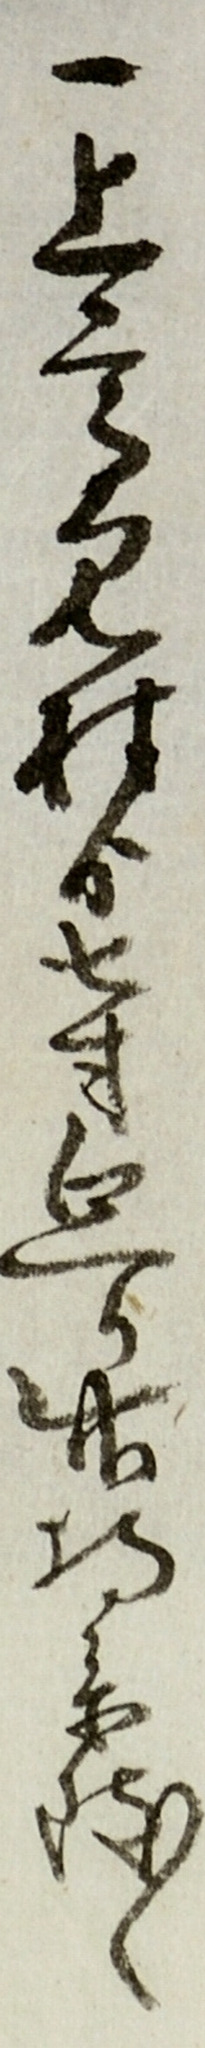一上高見村ゟ七寸廻り竹持参致候
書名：御山方御薪方諸事御用留
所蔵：伊那市立高遠町図書館・合同会社AMANE
